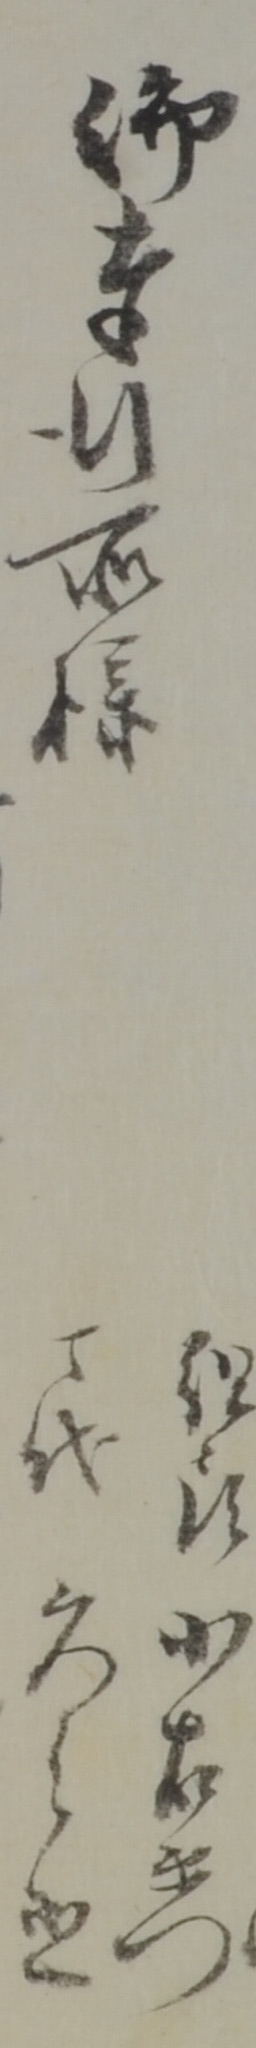御奉行所様町代久之丞
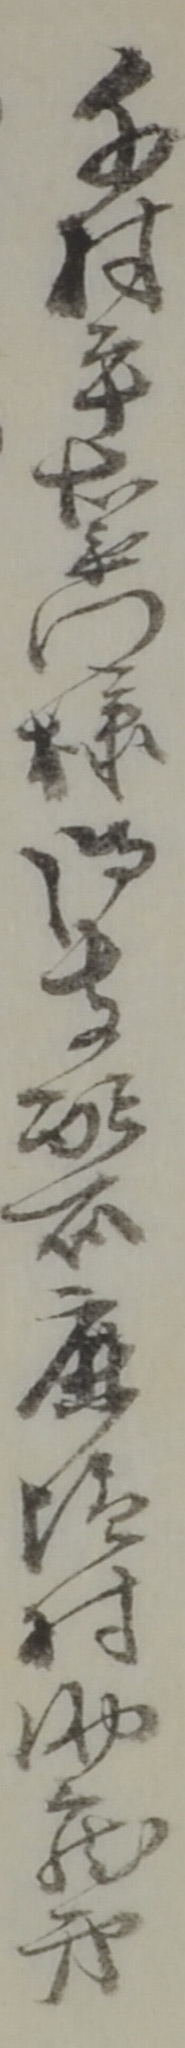千村平右衛門様御支配所鹿塩村助蔵弟
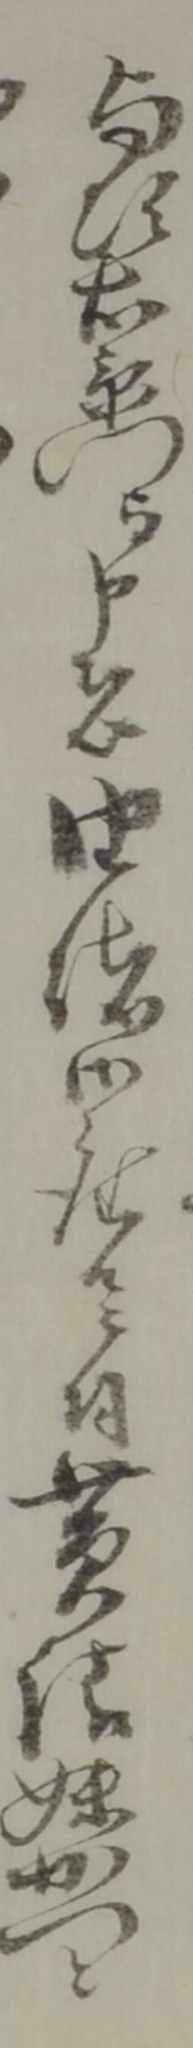与治右衛門と申者由緒御座候ニ付貰請妹かつと
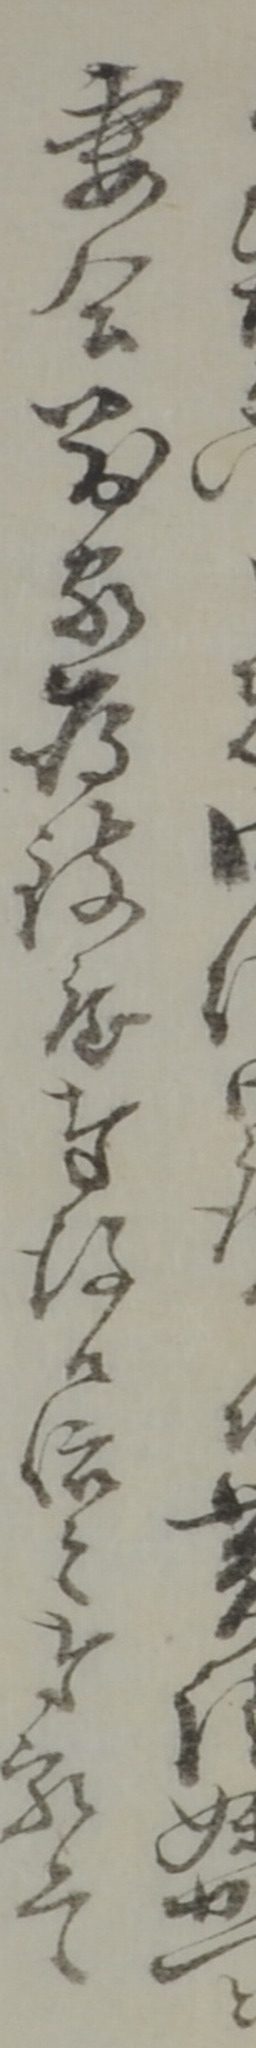妻合別家為致度奉存候依之奉願上候
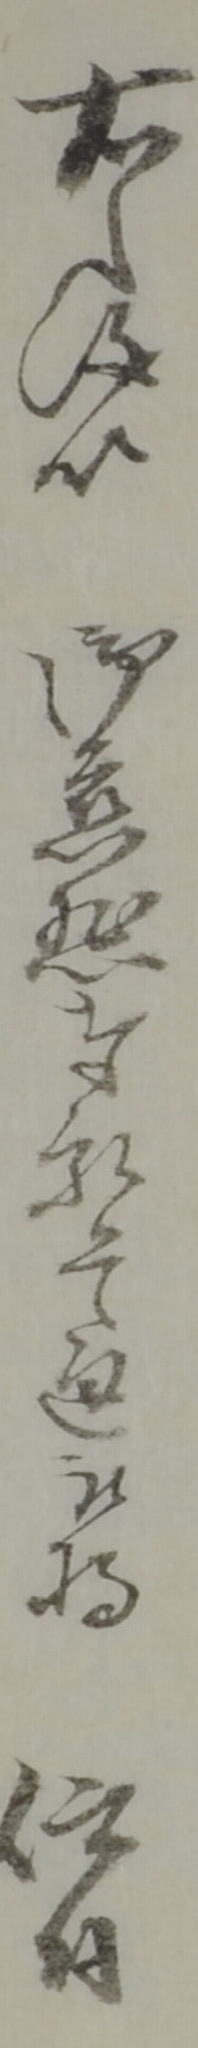右之趣以御慈悲奉願上候通被為仰付
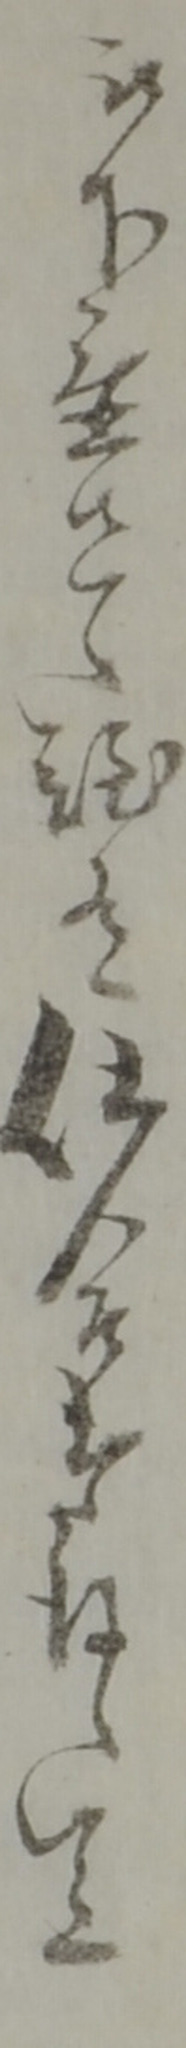被下置候ハヽ難有仕合奉存候以上
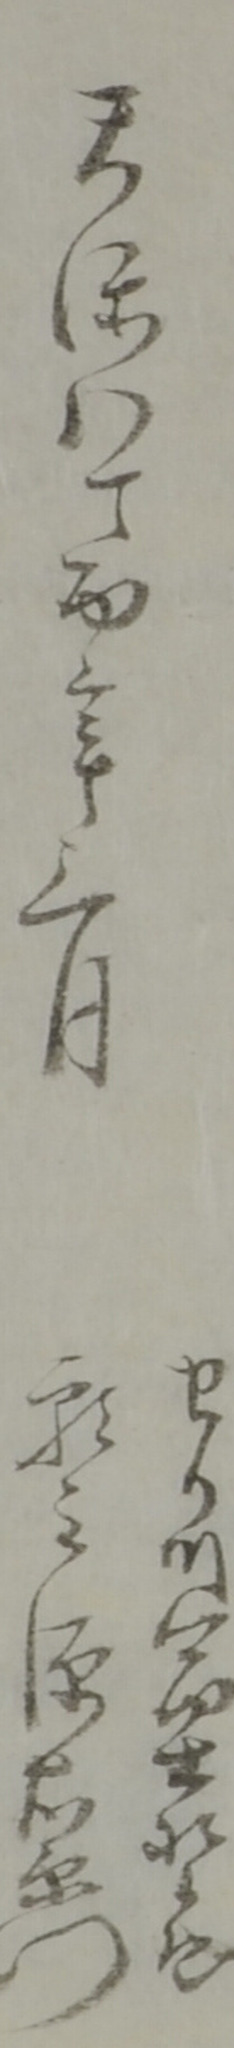天保八丁酉年三月願主源右衛門
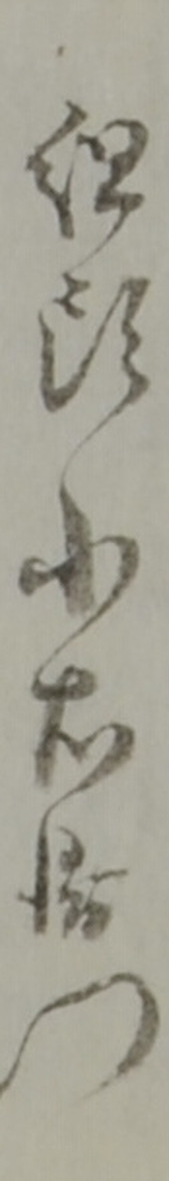組頭小右衛門
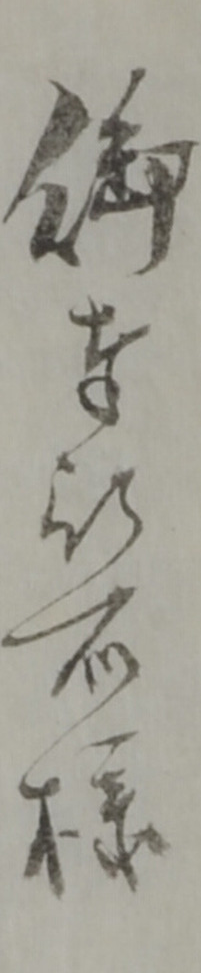御奉行所様
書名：諸願書控帳
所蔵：伊那市立高遠町図書館・合同会社AMANE
